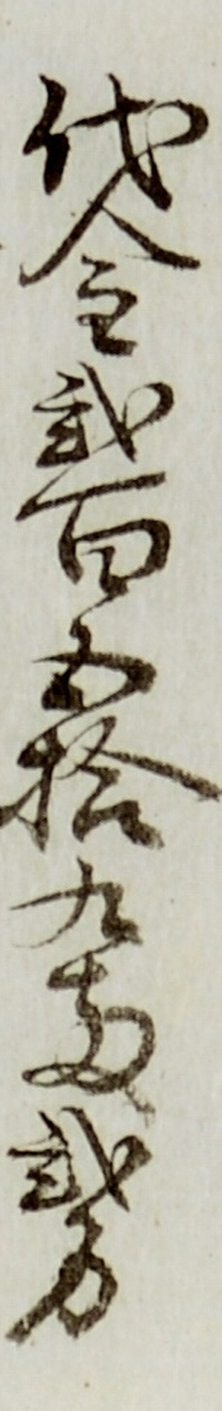代金弐百五拾九両弐分
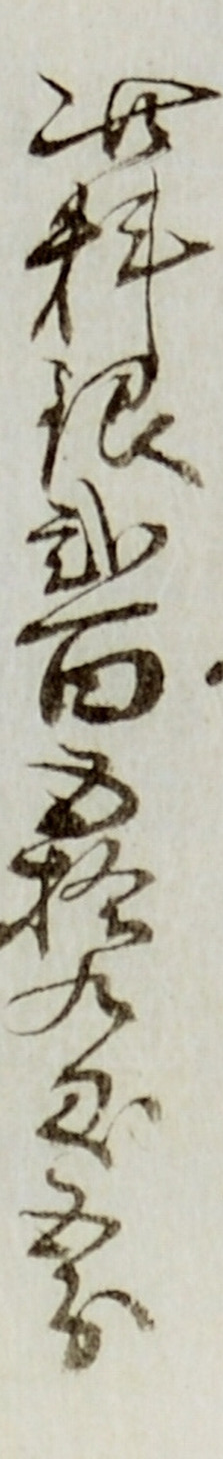此料銀弐百五拾九匁五分
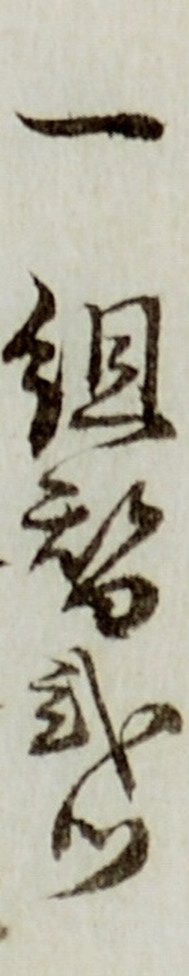一組替弐ツ
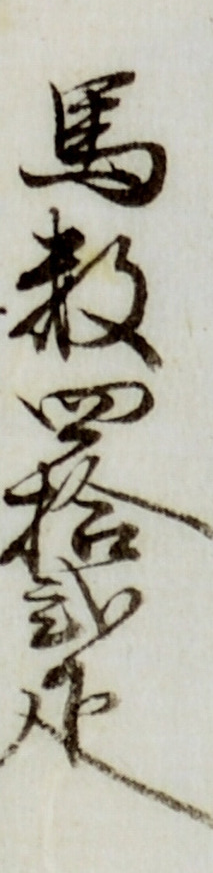〆馬数四拾弐疋
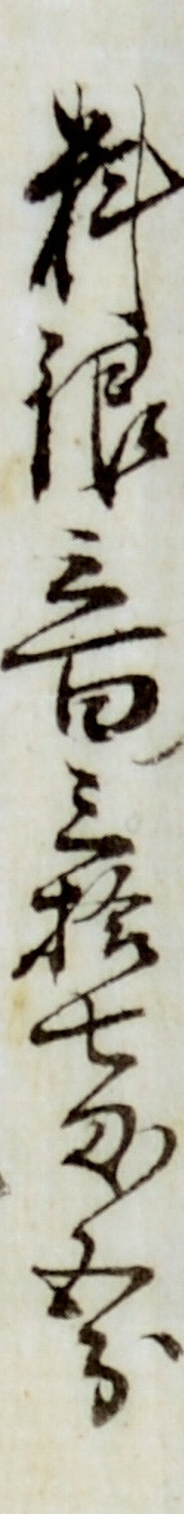料銀三百三拾七匁五分
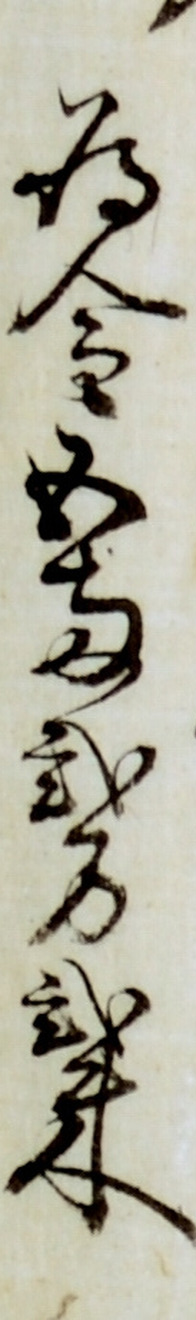為金五両弐分弐朱

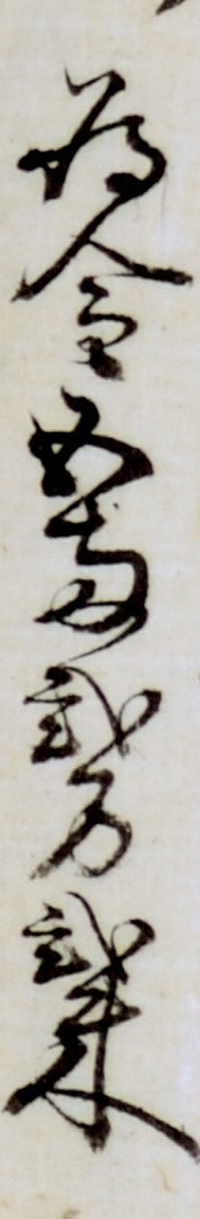金三両弐分弐朱
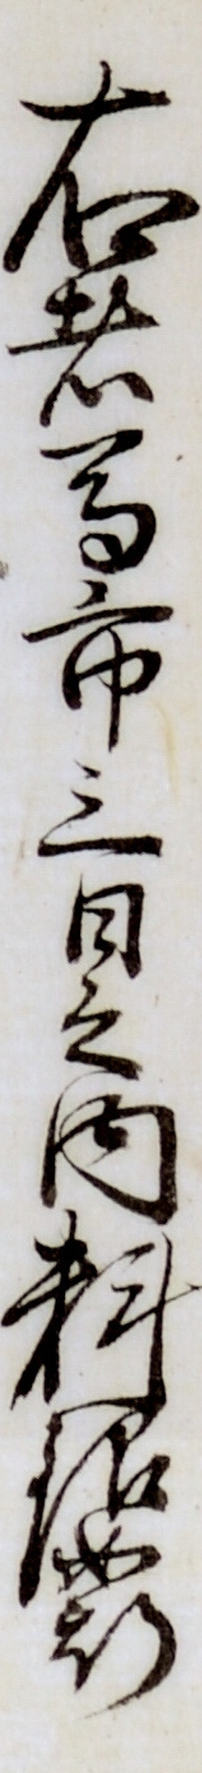右は馬市三日之内料銀如斯
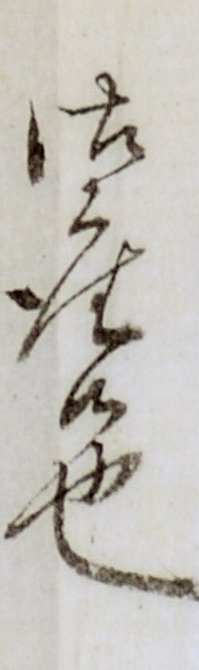御座候也
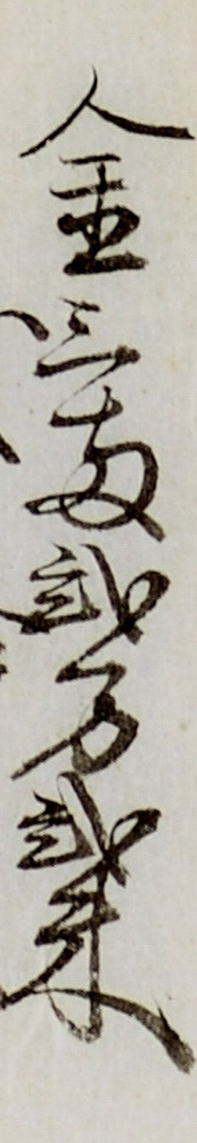金三両弐分弐朱
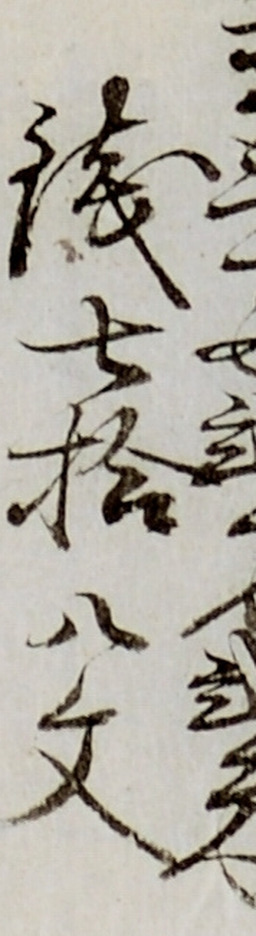銭七拾八文
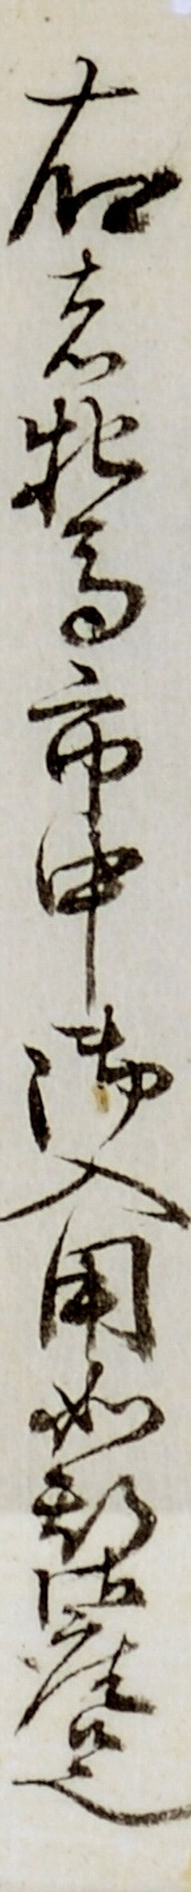右は牝馬市中御入用如斯御座候也
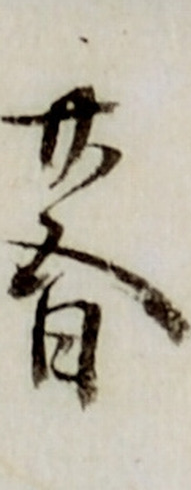廿五日
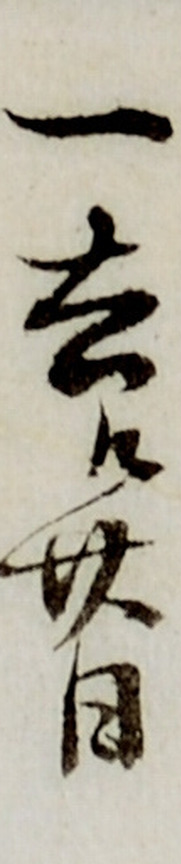一去ル廿日
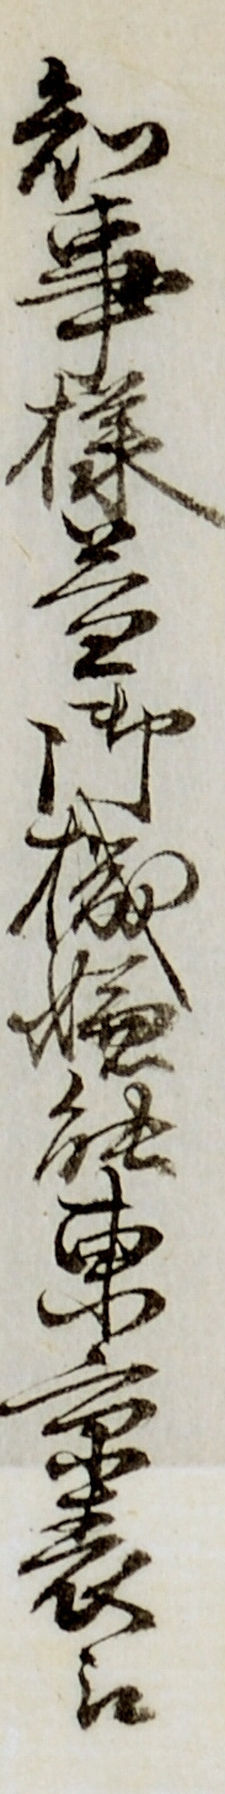知事様益御機嫌能東京表え
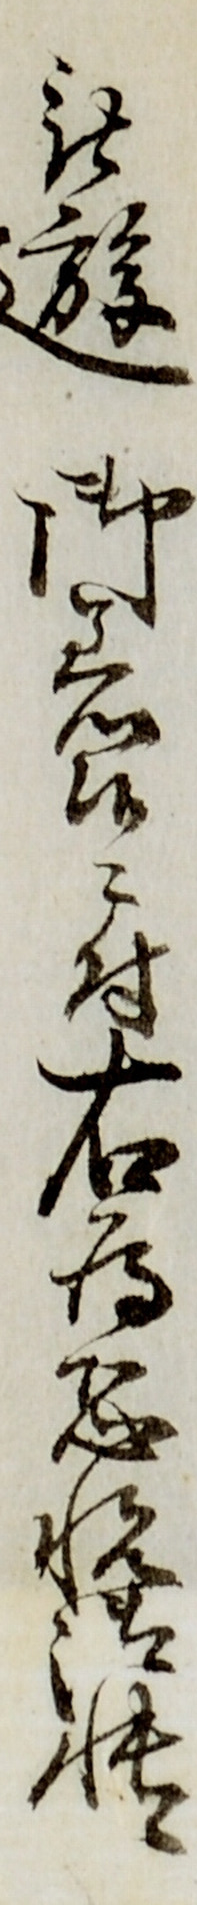被遊御着候に付右為恐悦御帳へ
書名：山林方諸事御用留
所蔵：伊那市立高遠町図書館・合同会社AMANE
